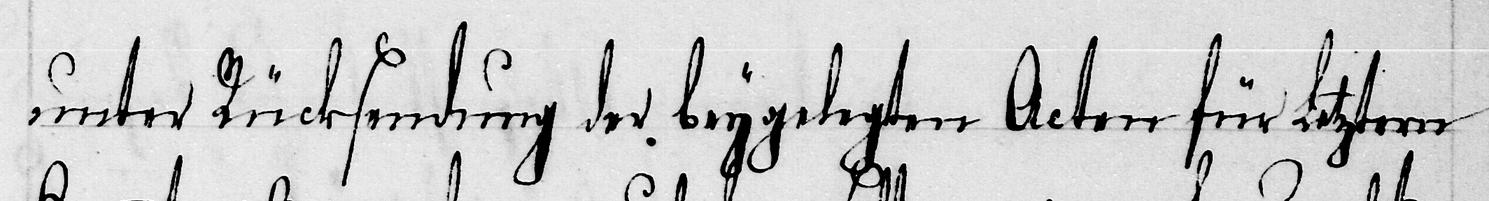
unter Rücksendung der beygelegten Acten für Letztern
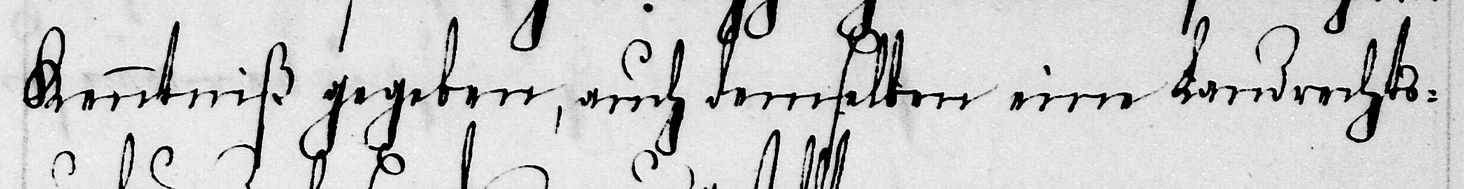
Kenntniß gegeben, auch demselben eine Landrechts¬
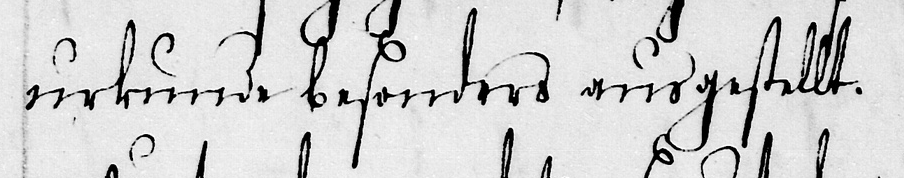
urkunde besonders ausgestellt.
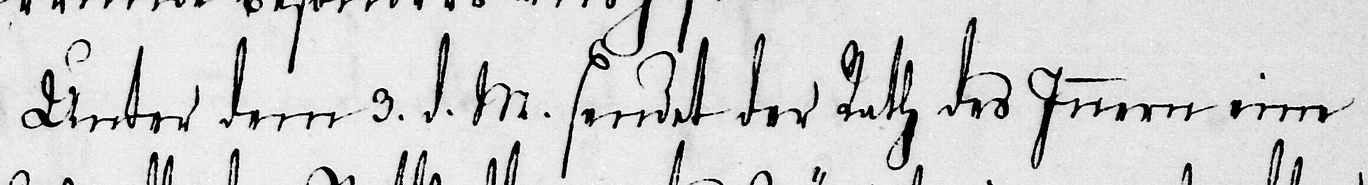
Unter dem 3. d. M. sendet der Rath des Innern eine
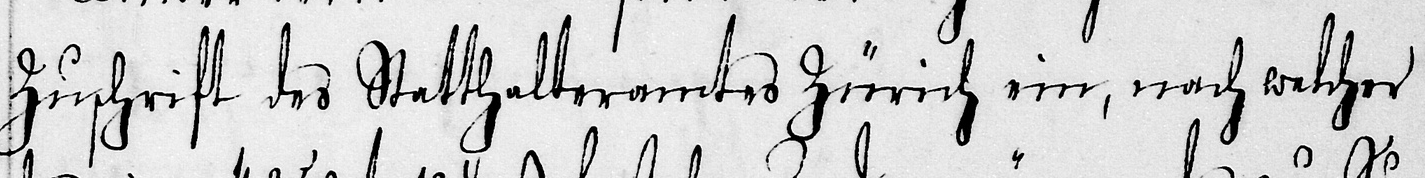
Zuschrift des Statthalteramtes Zürich ein, nach welcher
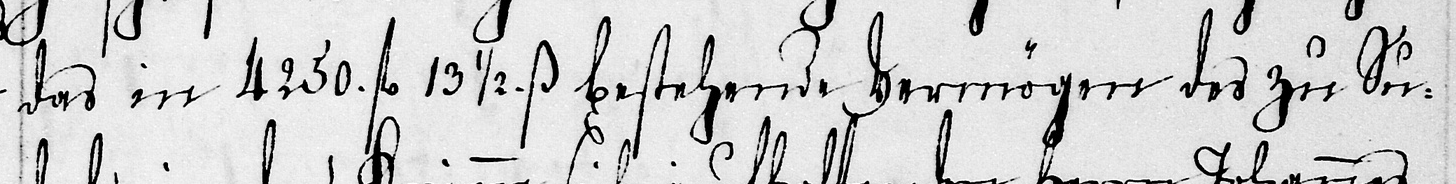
das in 4250 fl. 13 1/2. ß bestehende Vermögen des zu Su¬
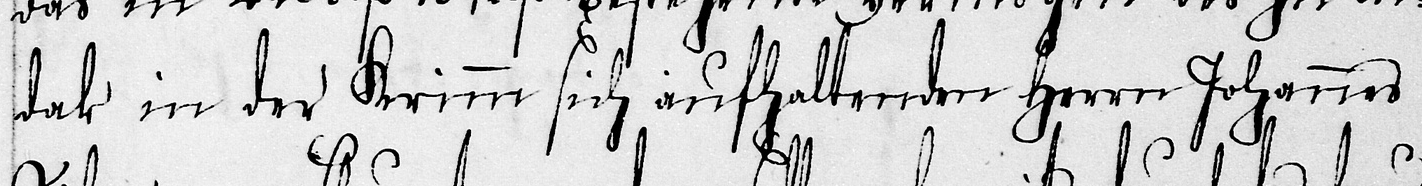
dak in der Krimm sich aufhaltenden Herrn Johannes
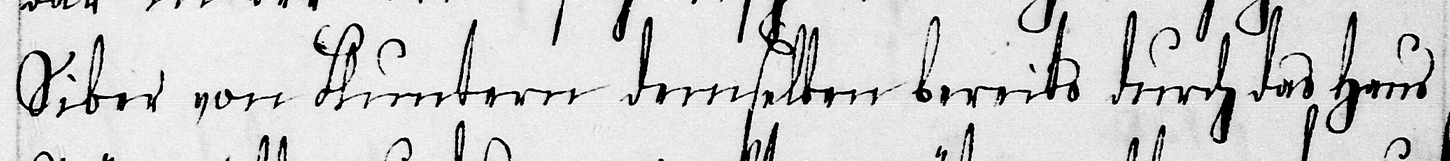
Siber von Fluntern demselben bereits durch das Haus
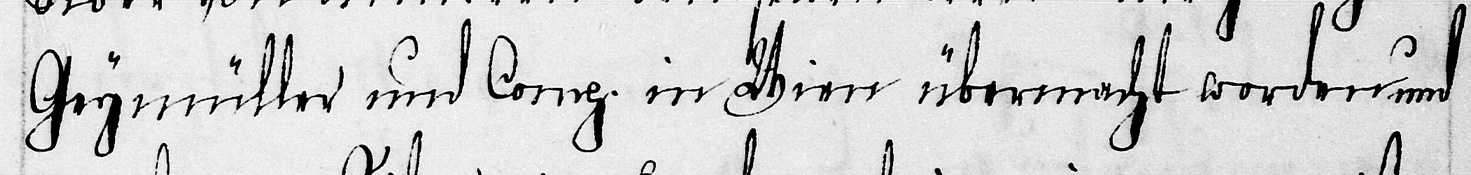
Geymüller und Comp. in Wien übermacht worden und
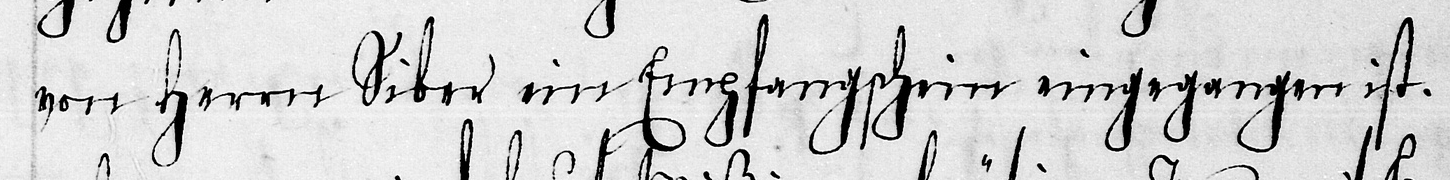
von Herrn Siber ein Empfangschein eingegangen ist.
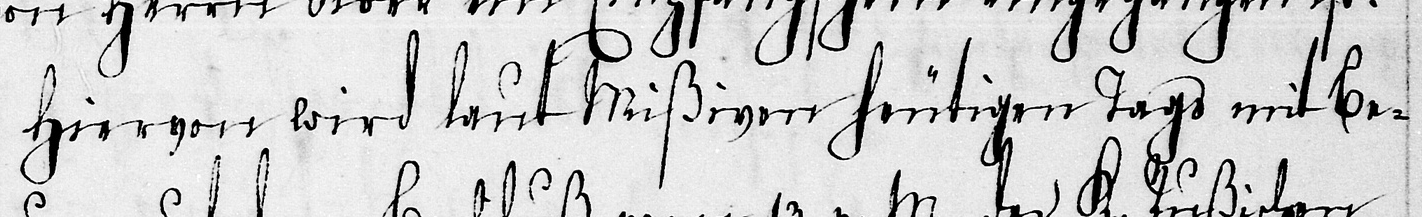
Hiervon wird laut Mißiven heutigen Tags mit Be¬
